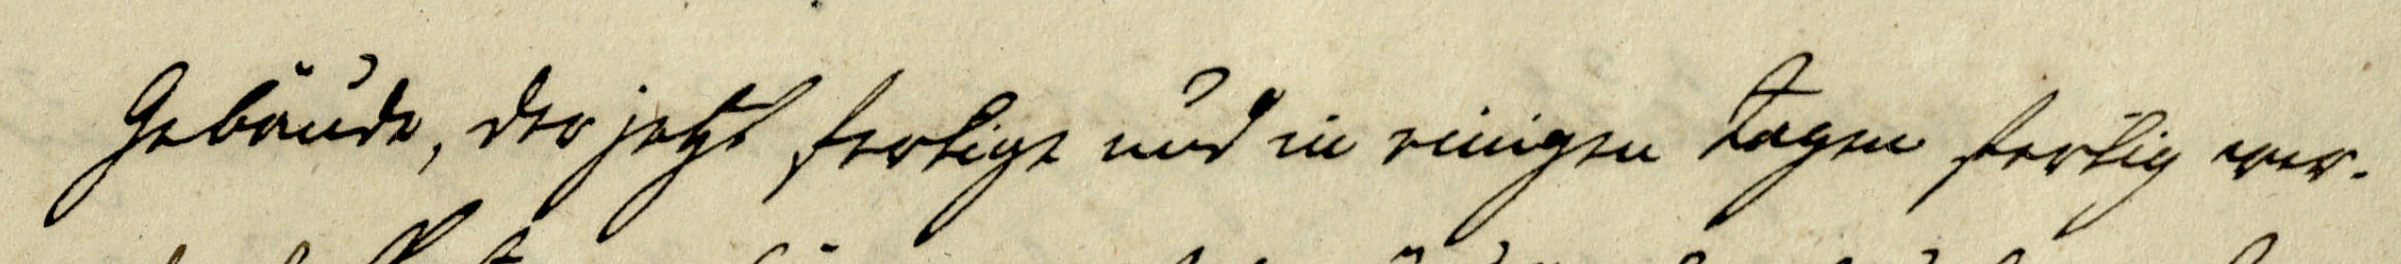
Gebäude, der jetzt fertige und in einigen Tagen fertig wer¬
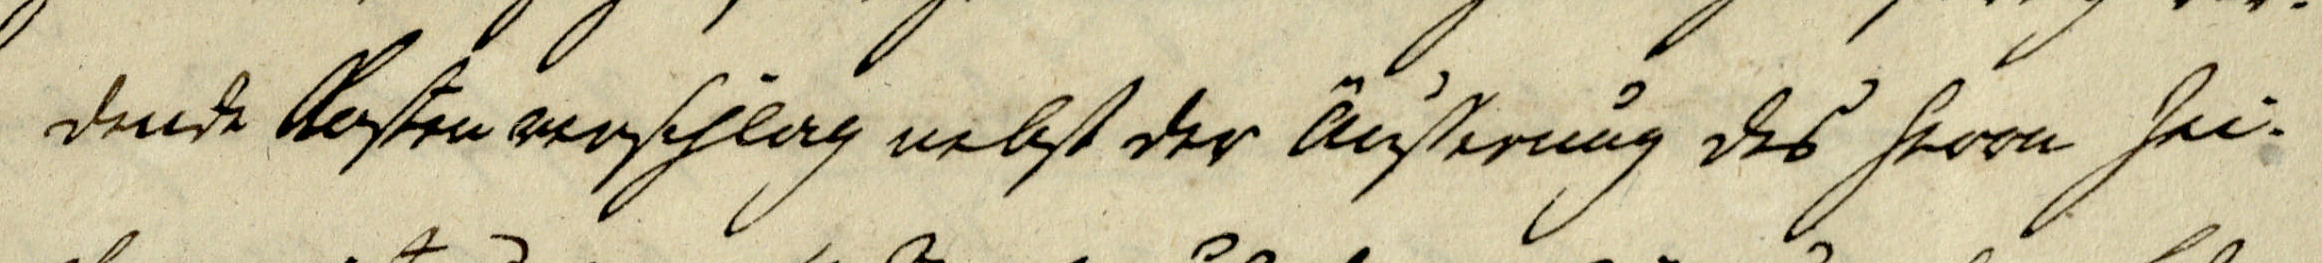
dende Kostenverschlag nebst der Äusserung des Herrn Zei¬
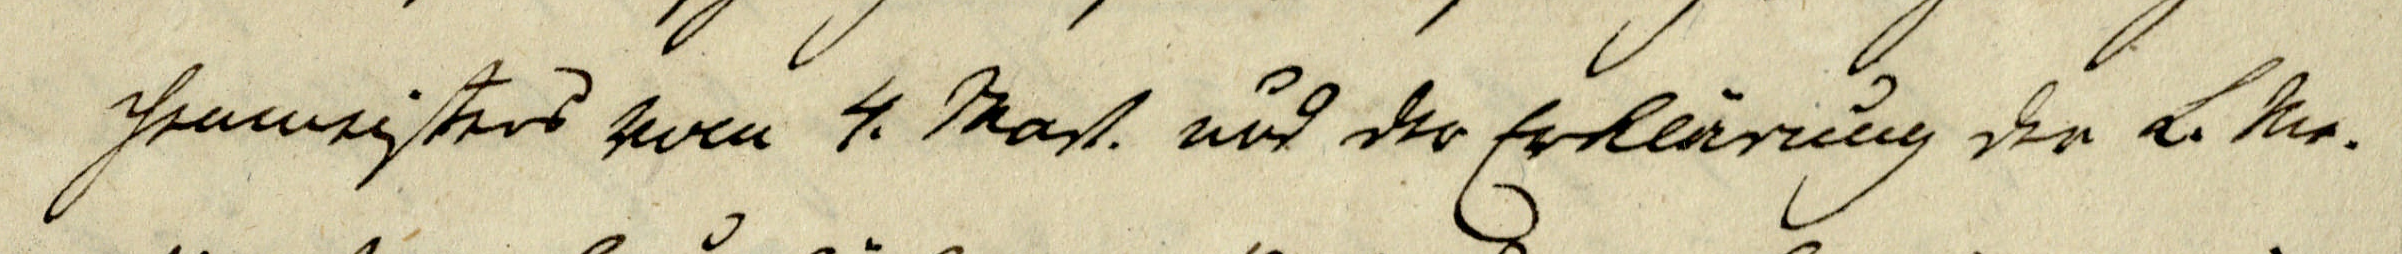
chenmeisters vom 4. Mart. und der Erklärung der L. Me¬
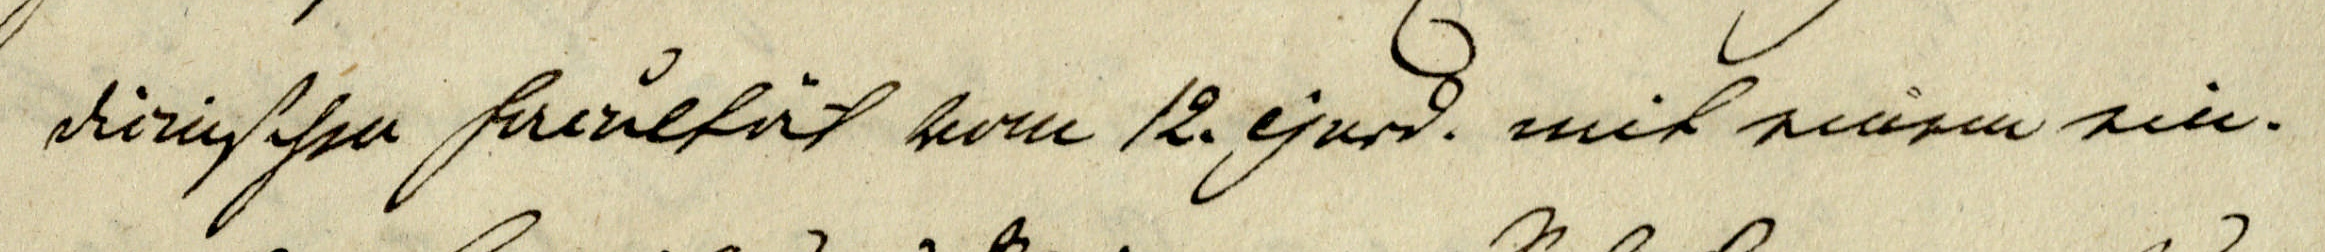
dicinischen Facultät vom 12. ejusd. mit einem ein¬
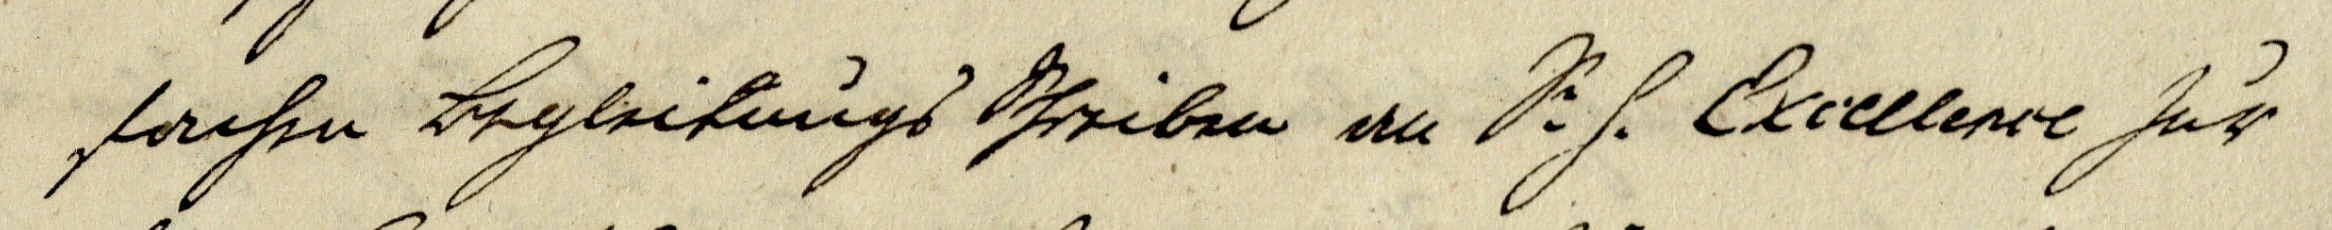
fachen Begleitungs Schreiben an Sr. h. Excellence zur
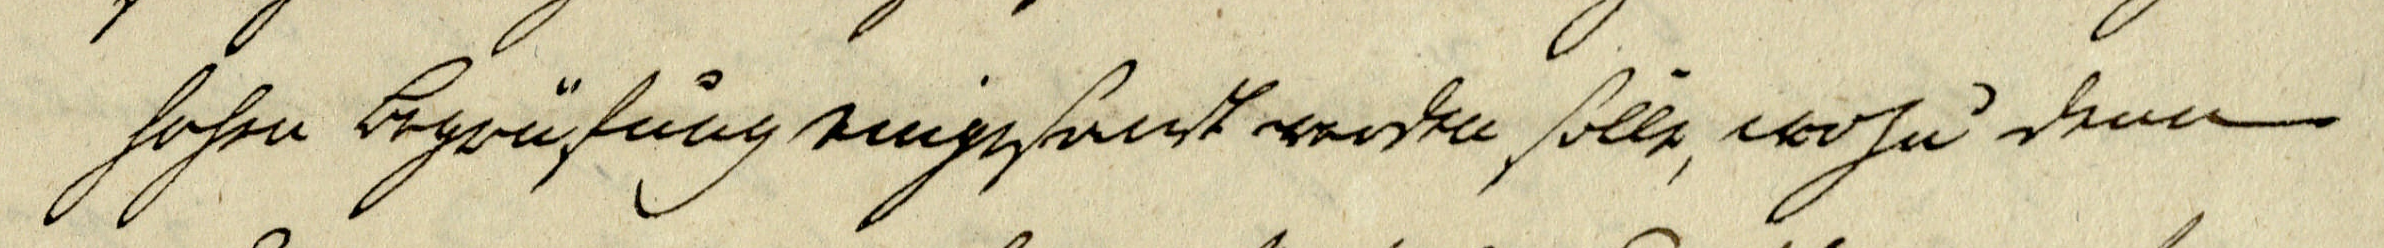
hohen Beprüfung eingesandt werden solle, wozu denn
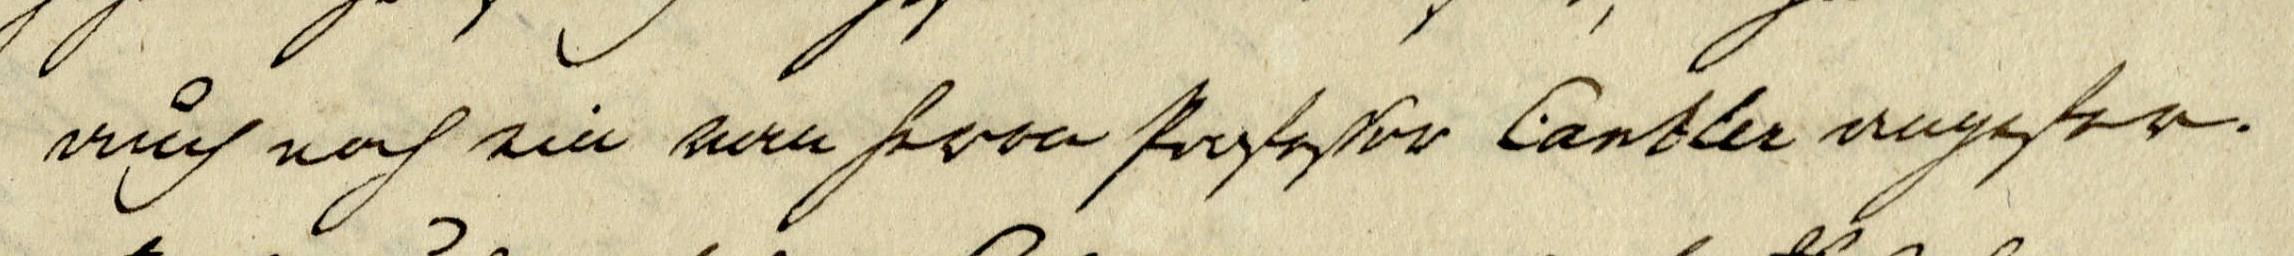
auch noch ein von Herrn Professor Canzler angefer¬
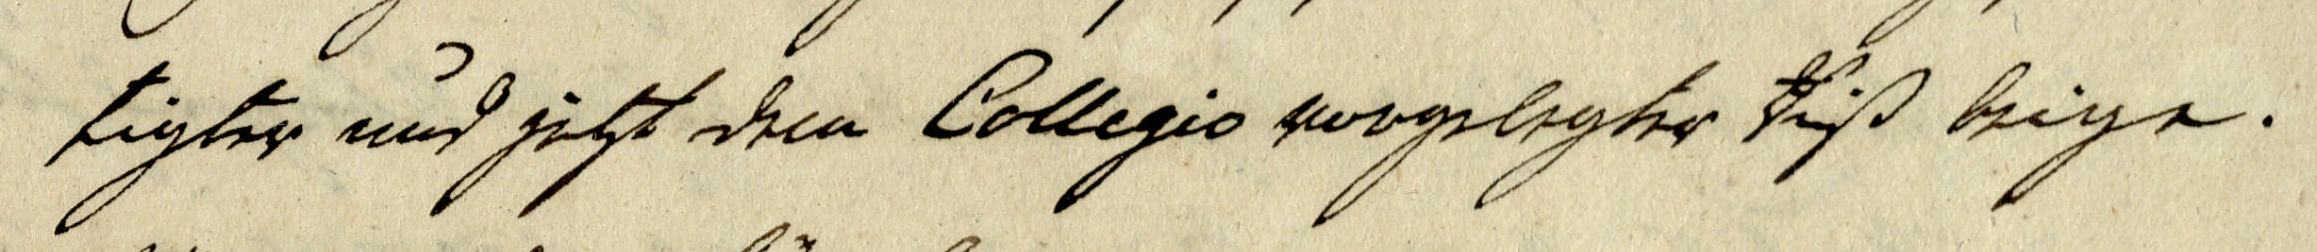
tigter und jetzt dem Collegio vorgelegter Riß beige¬
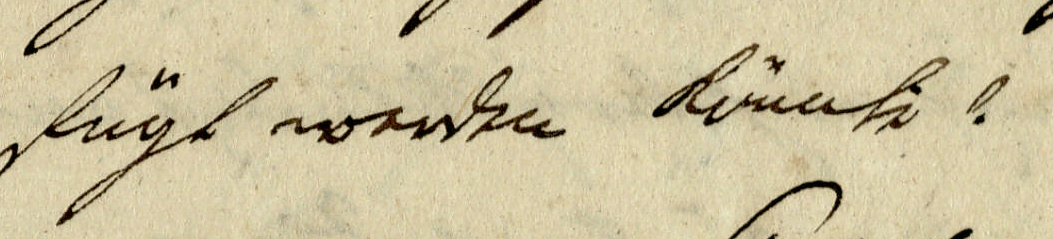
fügt werden könnte?
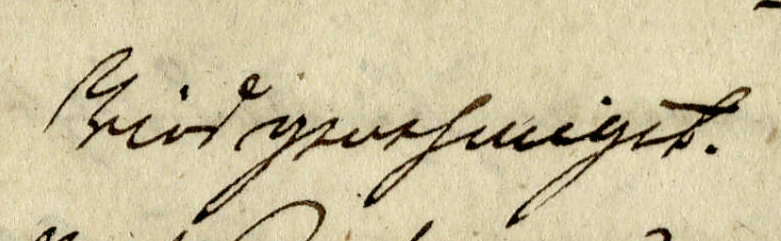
Wird genehmiget.
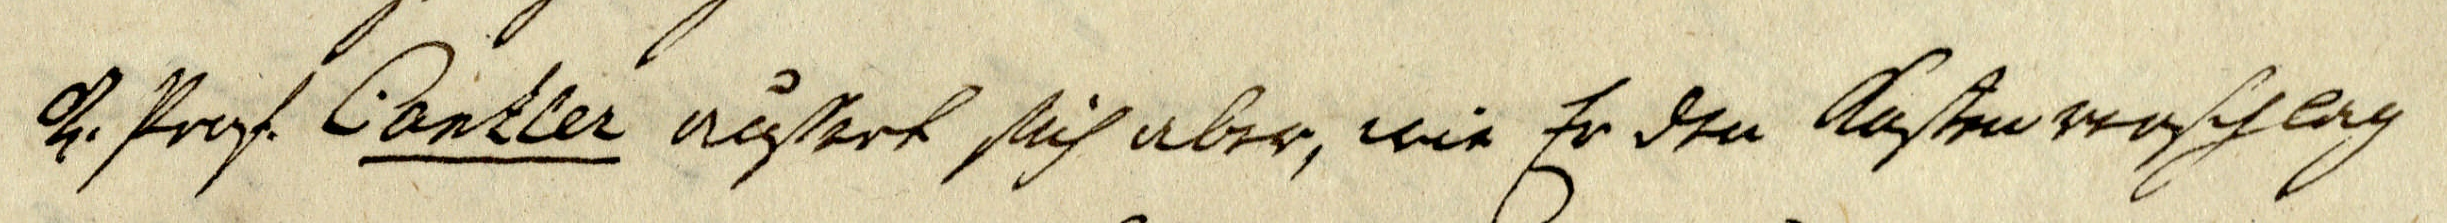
dh. Prof. Canzler äussert sich aber, wie Er den Kostenverschlag
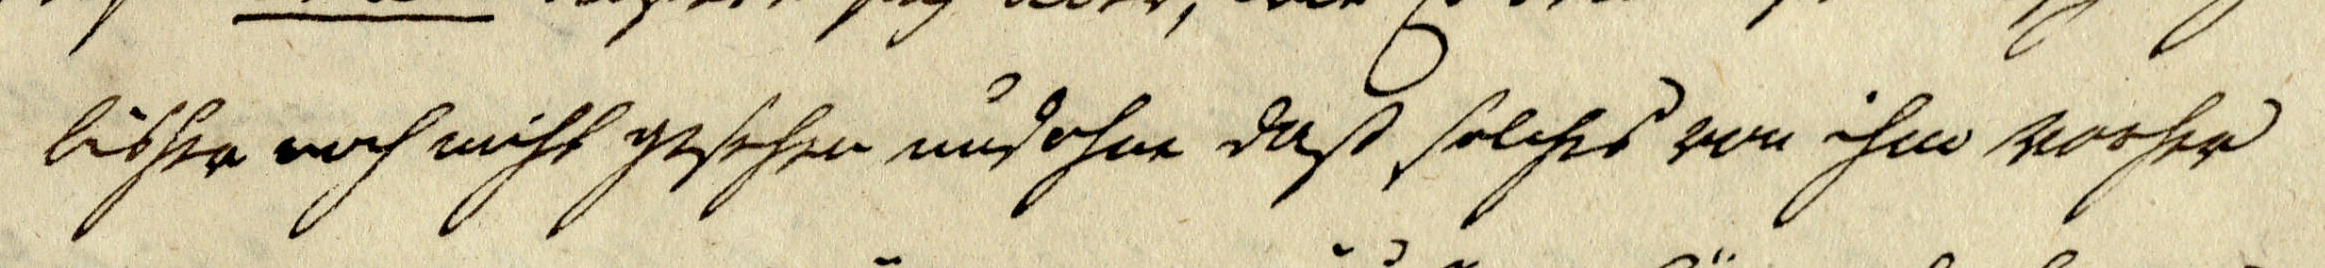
bisher noch nicht gesehen und ohne daß solches von ihm vorher
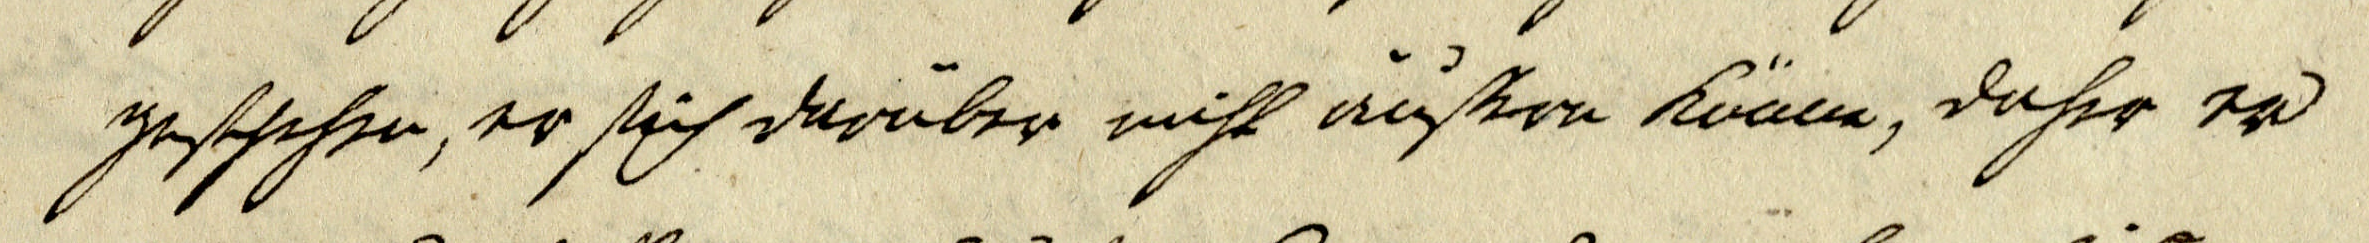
geschehen, er sich darüber nicht äussern könne, daher er
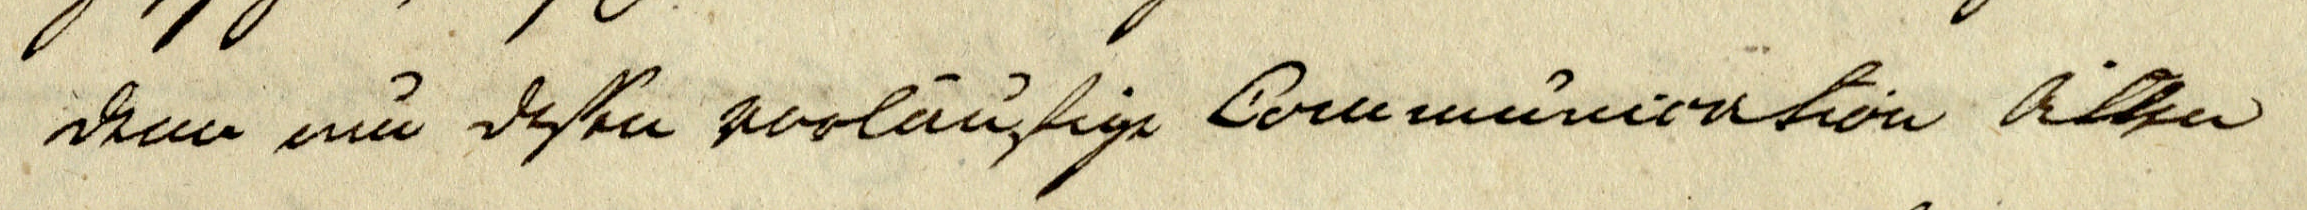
denn um dessen vorläufige Communication bitten
